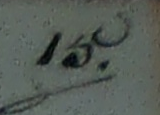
15.
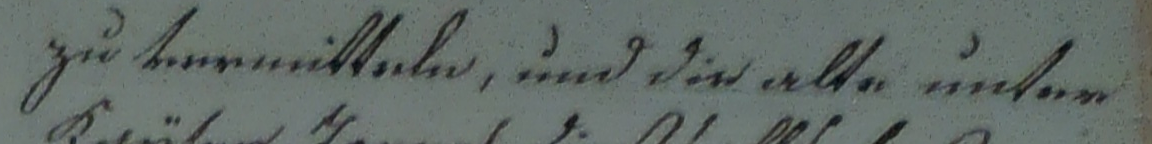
zu vermitteln, und die alte unter
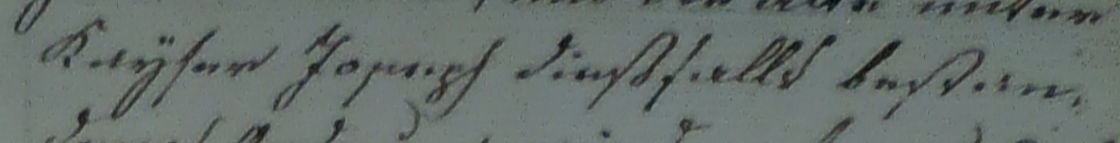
Kayser Joseph dießfalls bestan¬
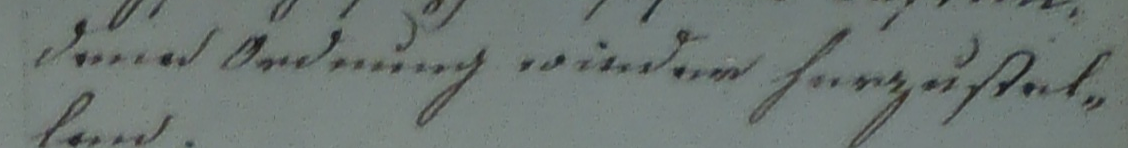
dene Ordnung wieder herzustel¬
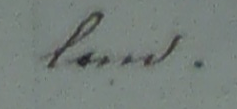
len.
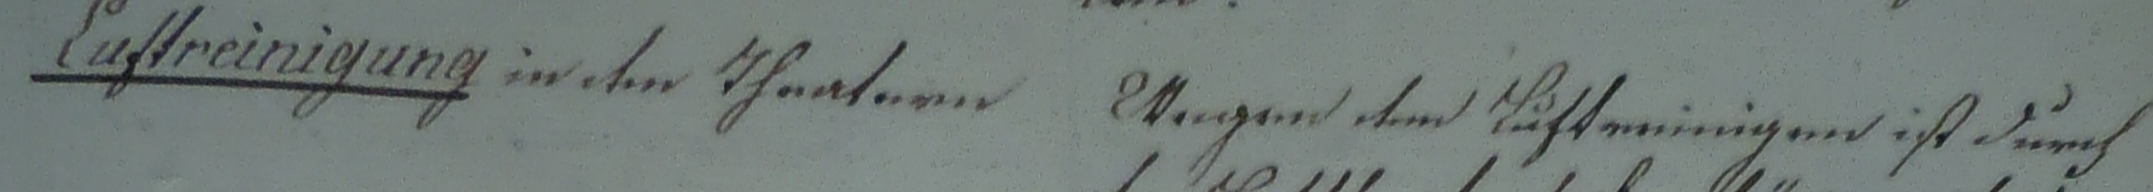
Luftreinigung in den Theatern Wegen dem Luftreinigen ist durch
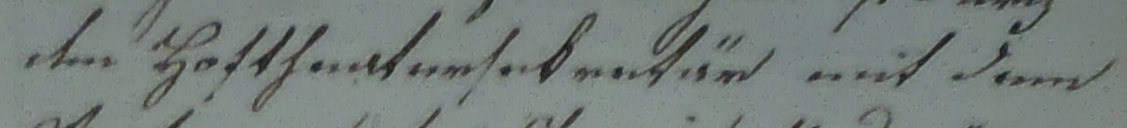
den Hoftheatersekretär mit dem
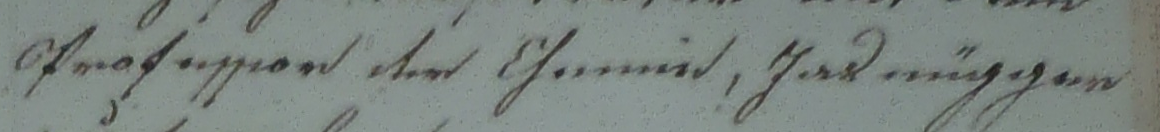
Professor der Chemie, Jasnüggen
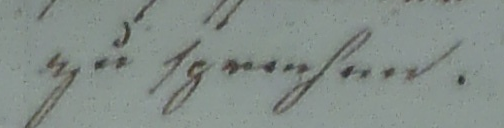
zu sprechen.
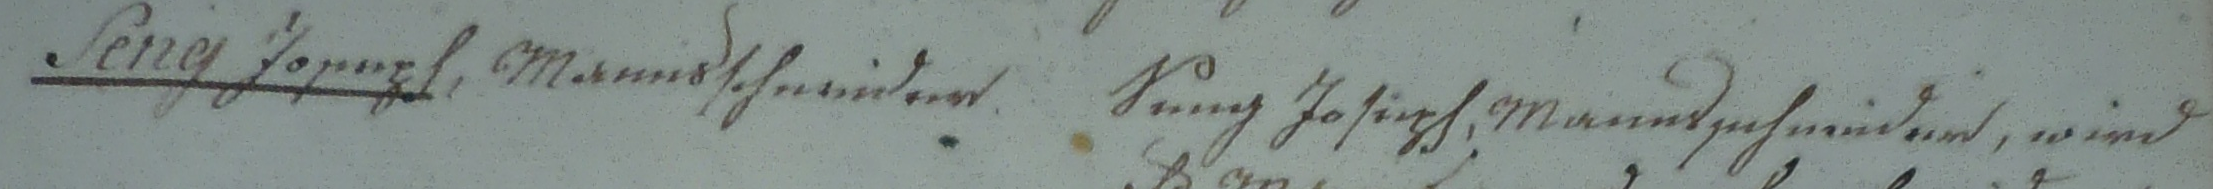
Seng Joseph, Mannsschneider Seng Joseph, Mannsschneider, wird
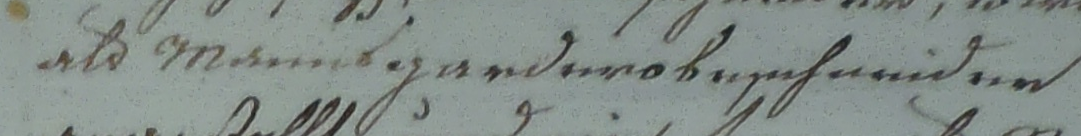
als Mannsgarderobeschneider
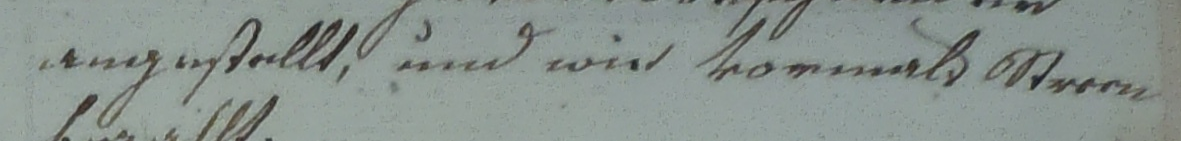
angestellt, und wie vormals Streen
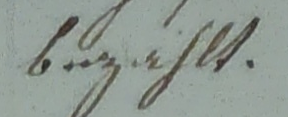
bezahlt.
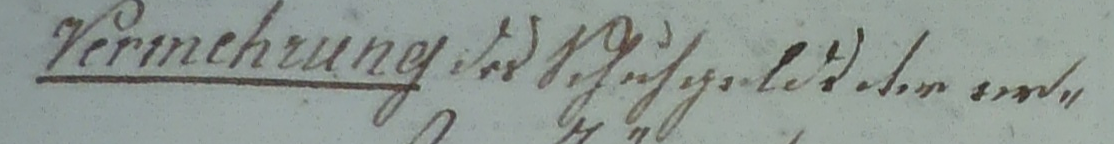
Vermehrung des Schuhgelds der er¬
